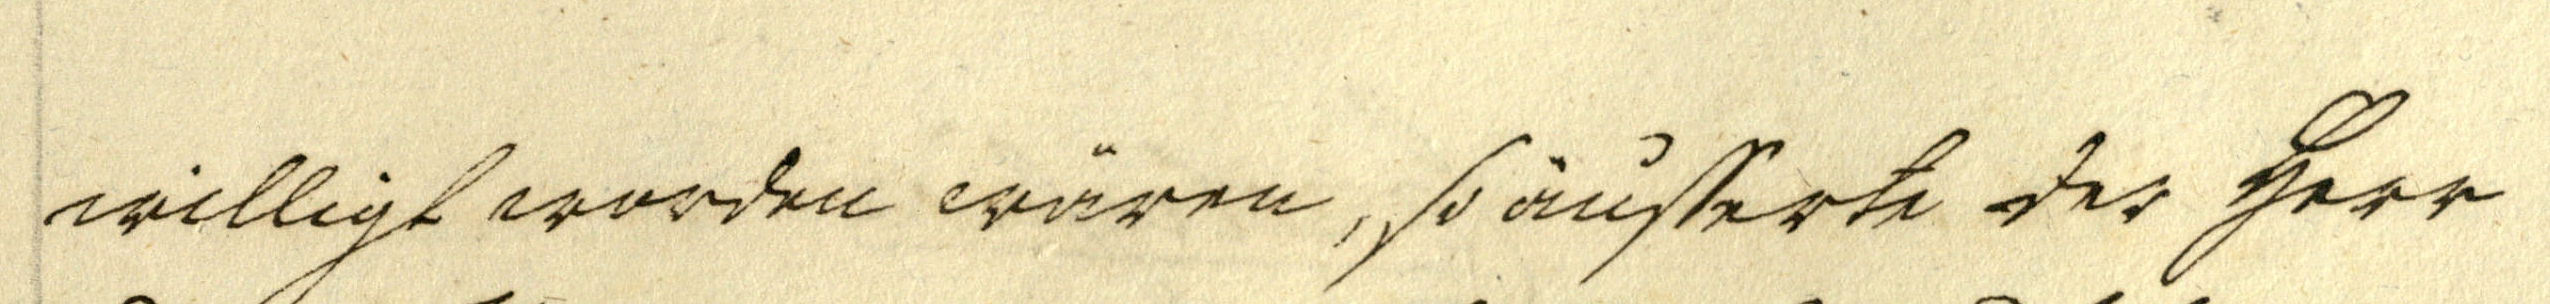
willigt worden wären, so äusserte der Herr
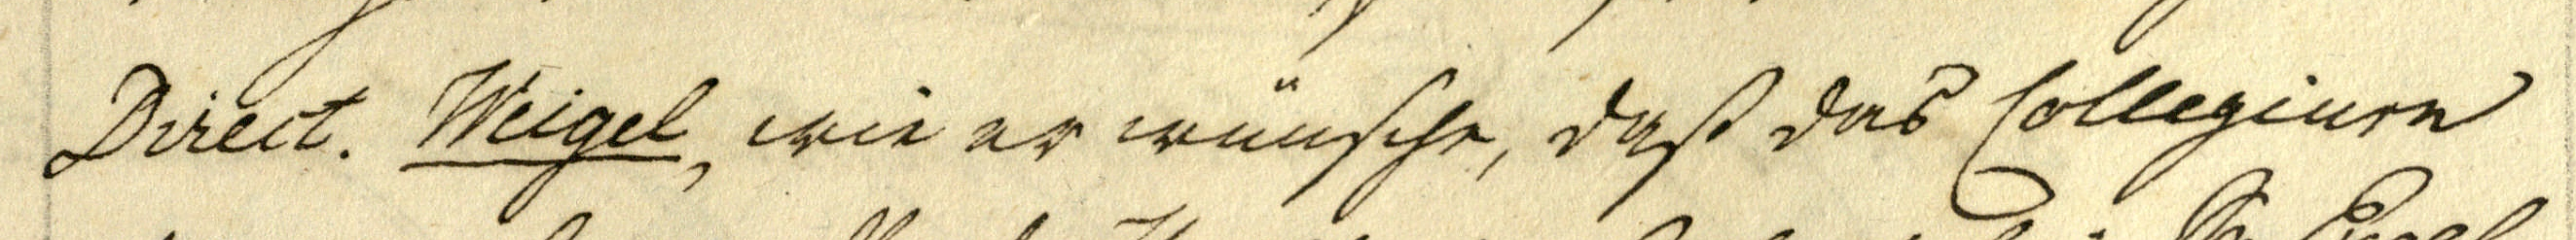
Direct. Weigel, wie er wünsche, daß das Collegium
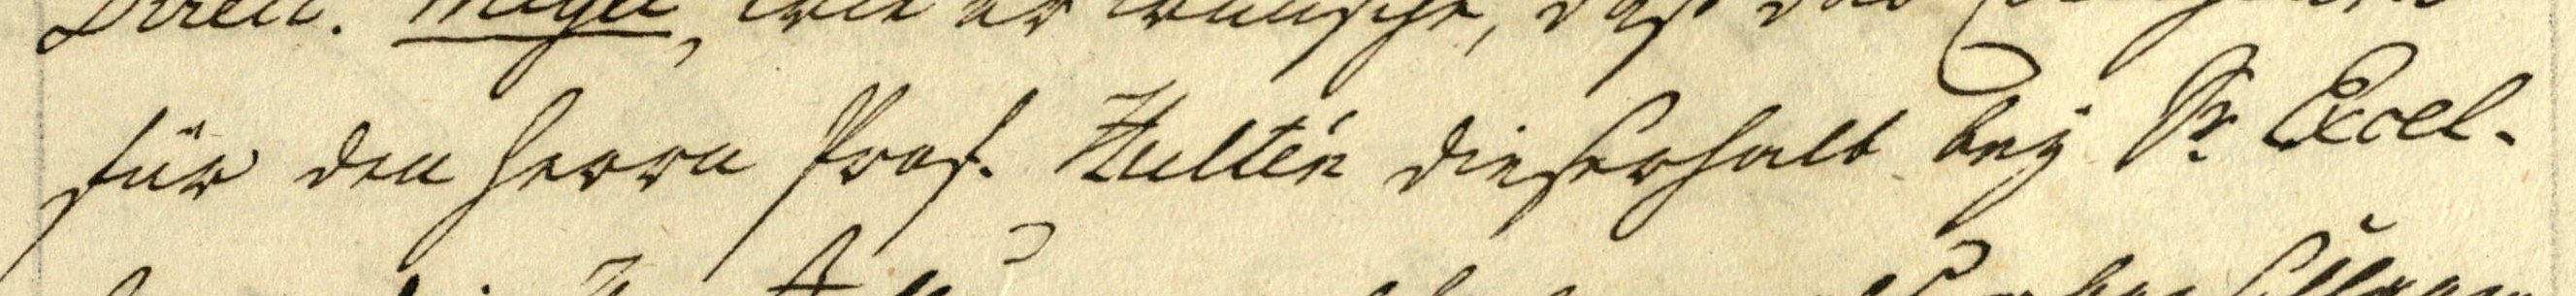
für den Herrn Prof. Hultén dieserhalb beÿ Sr Excel¬
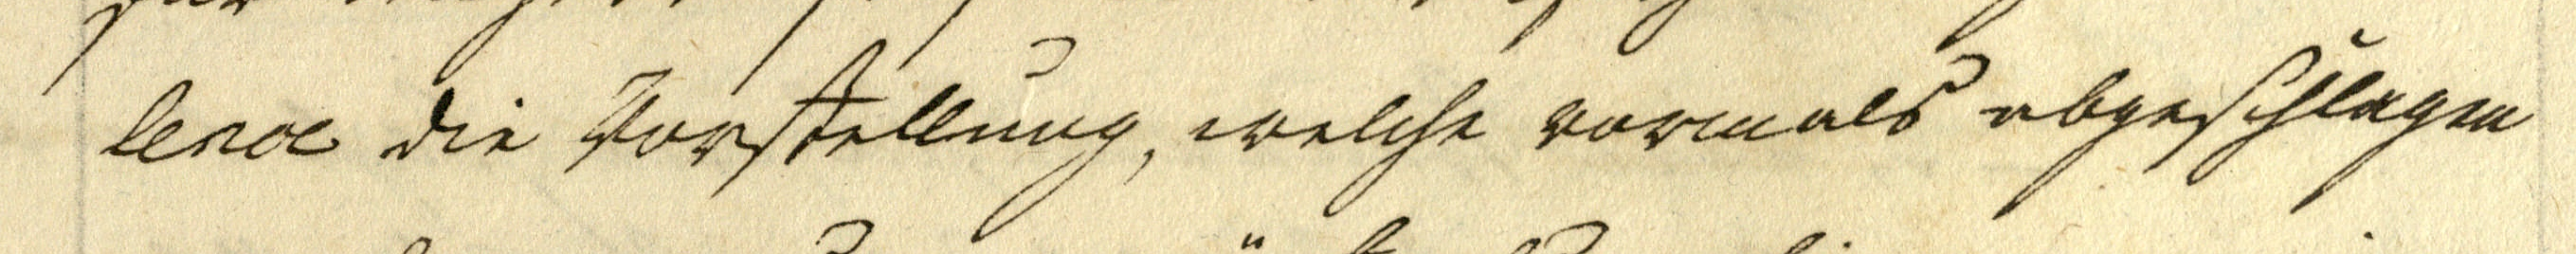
lence die Vorstellung, welche vormals abgeschlagen
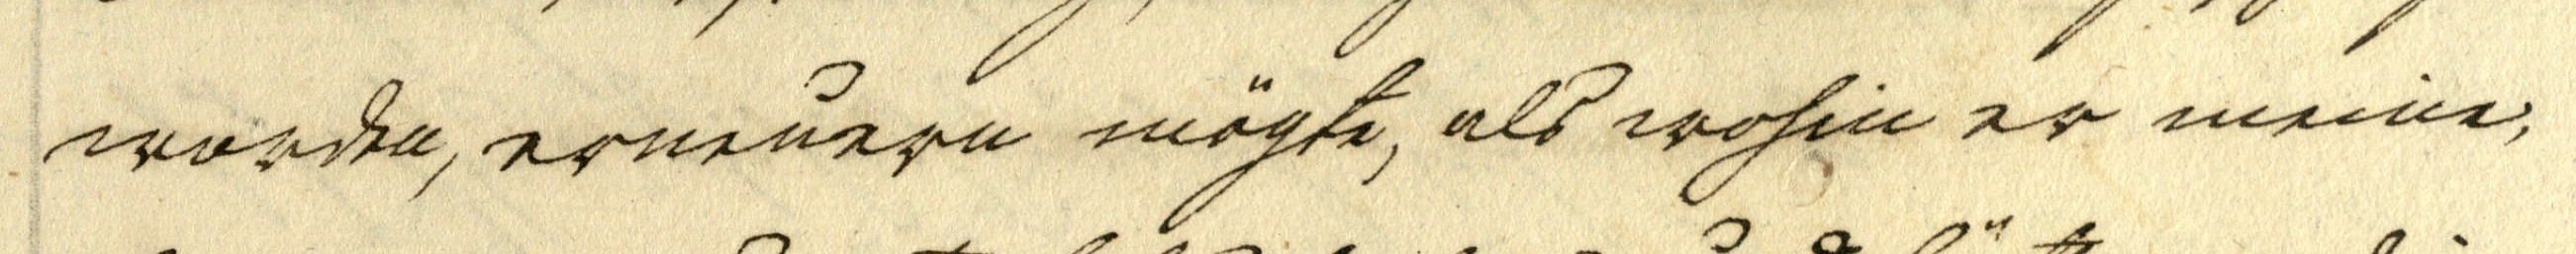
worden, erneuern mögte, als wohin er meine,
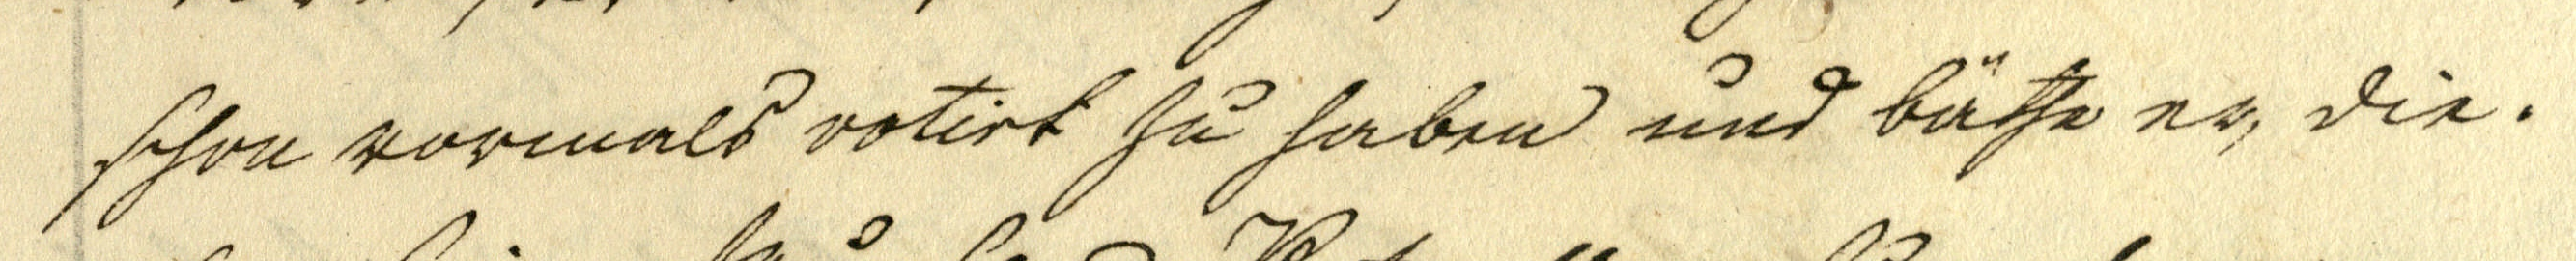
schon vormals votirt zu haben und bäthe er, die¬
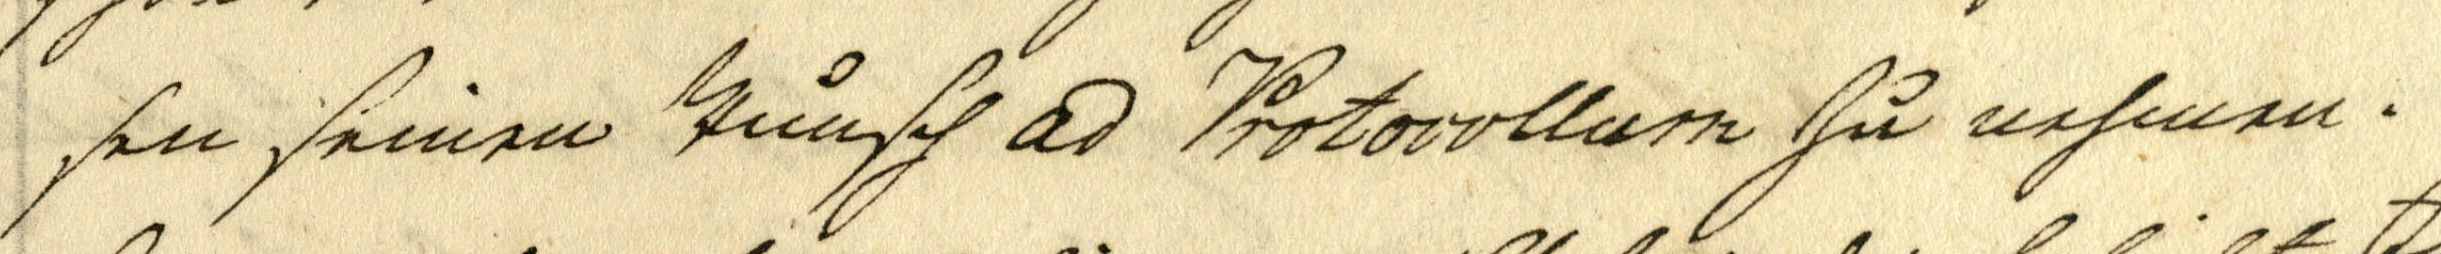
sen seinen Wunsch ad Protocollum zu nehmen.
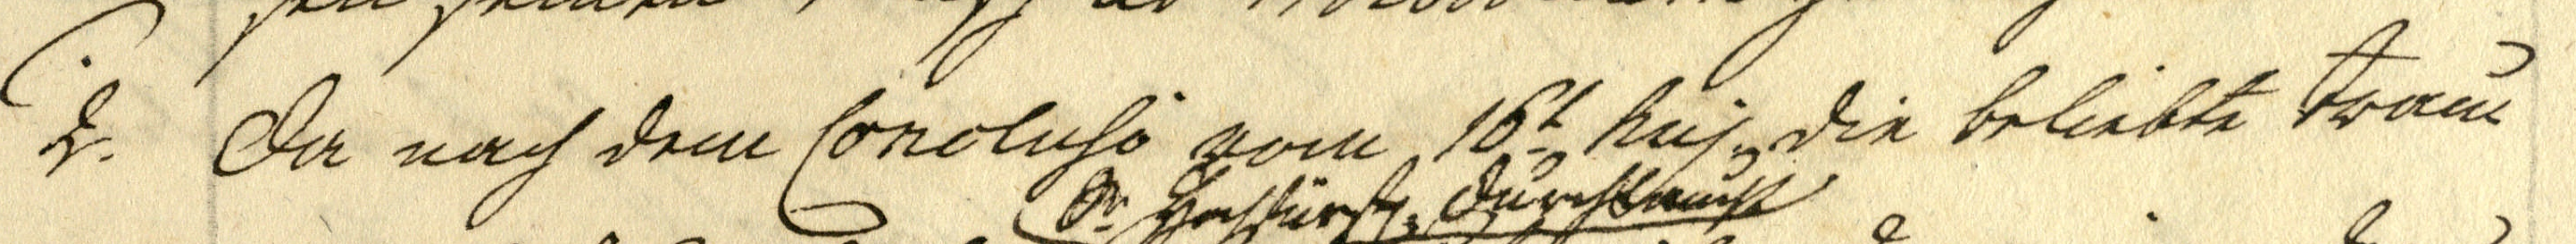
2. Da nach dem Concluso vom 16, huj. die beliebte Trau¬
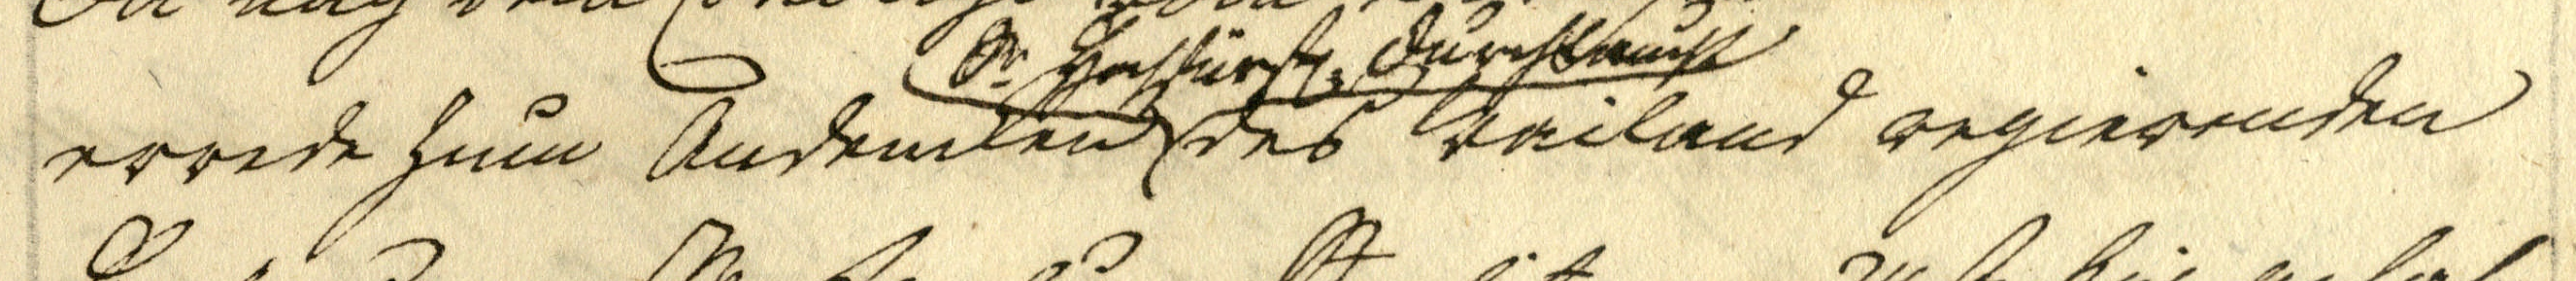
errede zum Andencken Sr Hochfürstl. Durchlaucht des weiland regierenden
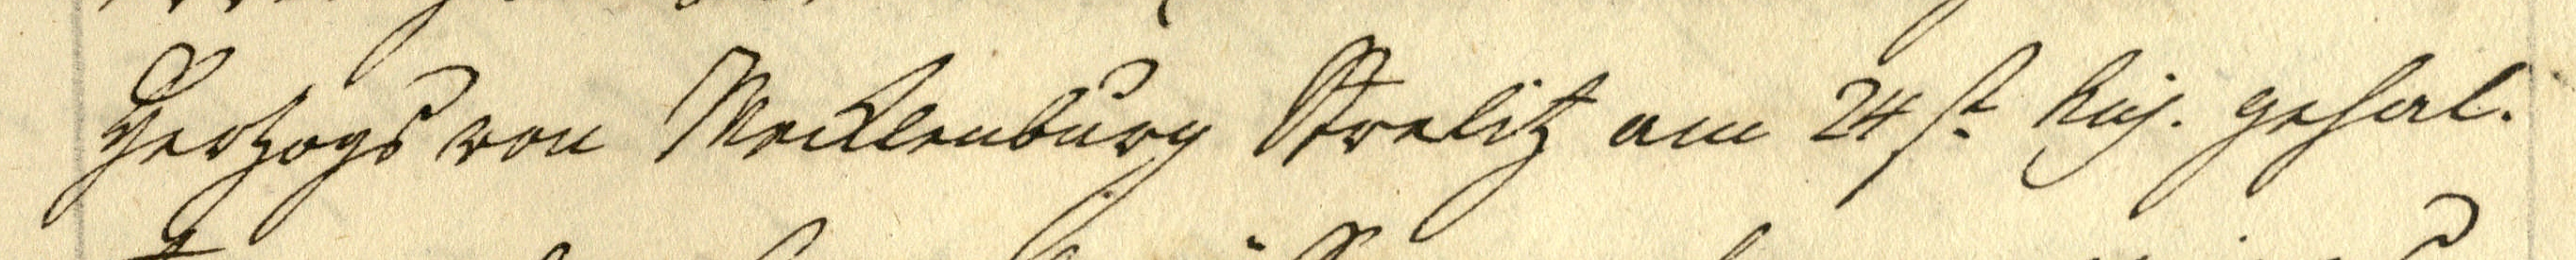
Herzogs von Mecklenburg Strelitz am 24 st huj. gehal¬
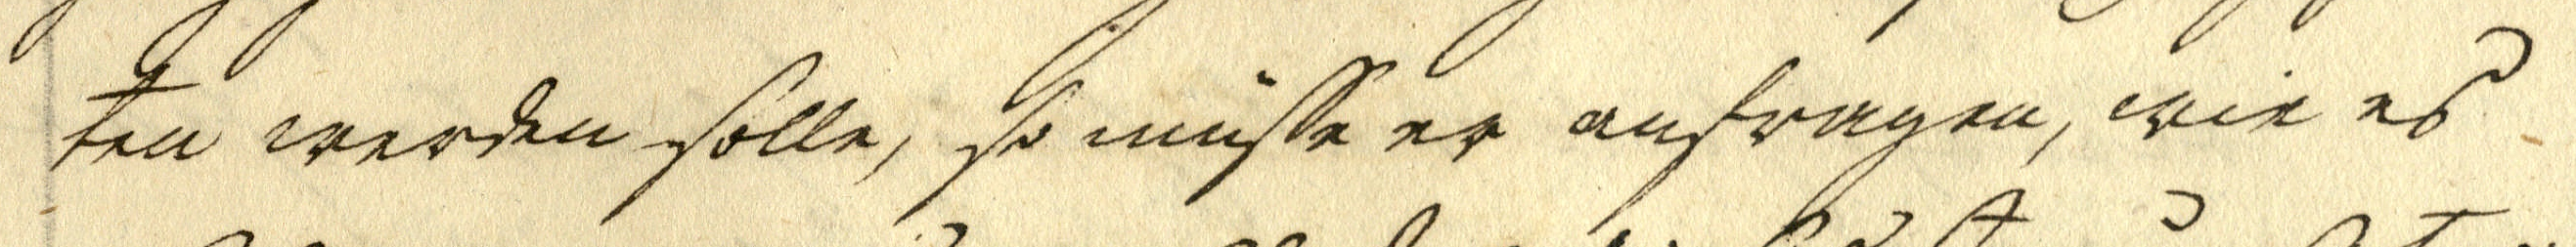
ten werden solle, so müsse er anfragen, wie er
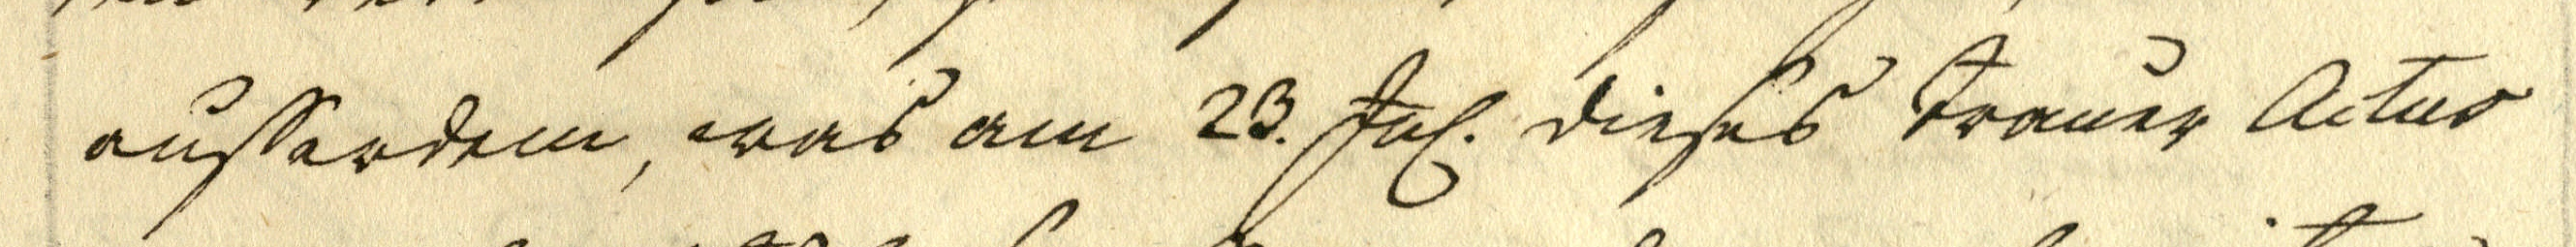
ausserdem, was am 28. Jul. dieses Trauer Actus
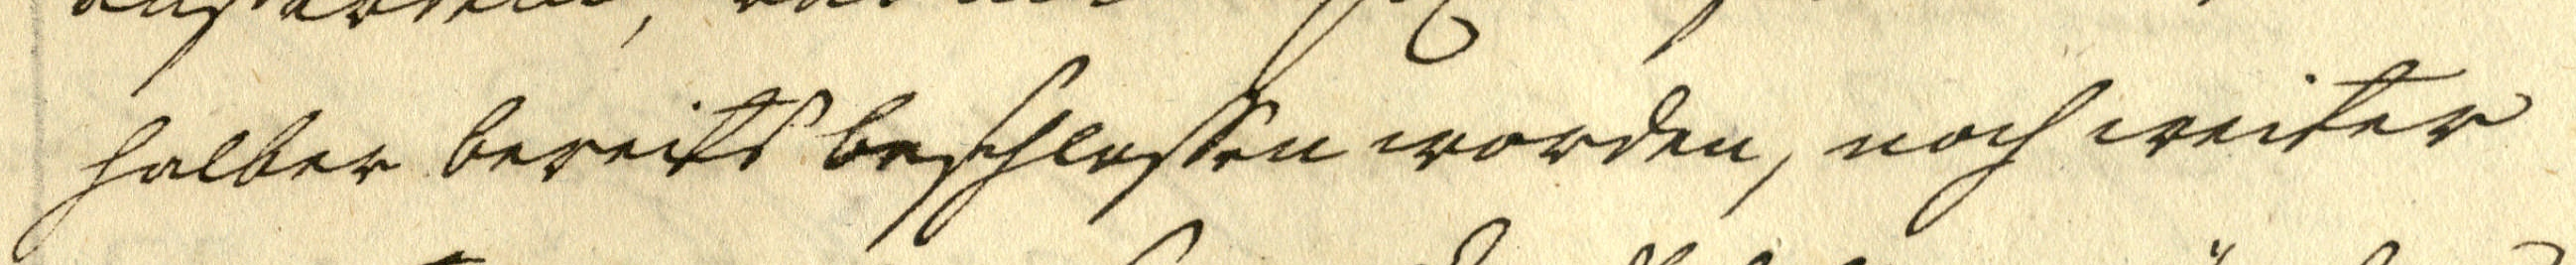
halber bereits beschlossen worden, noch weiter
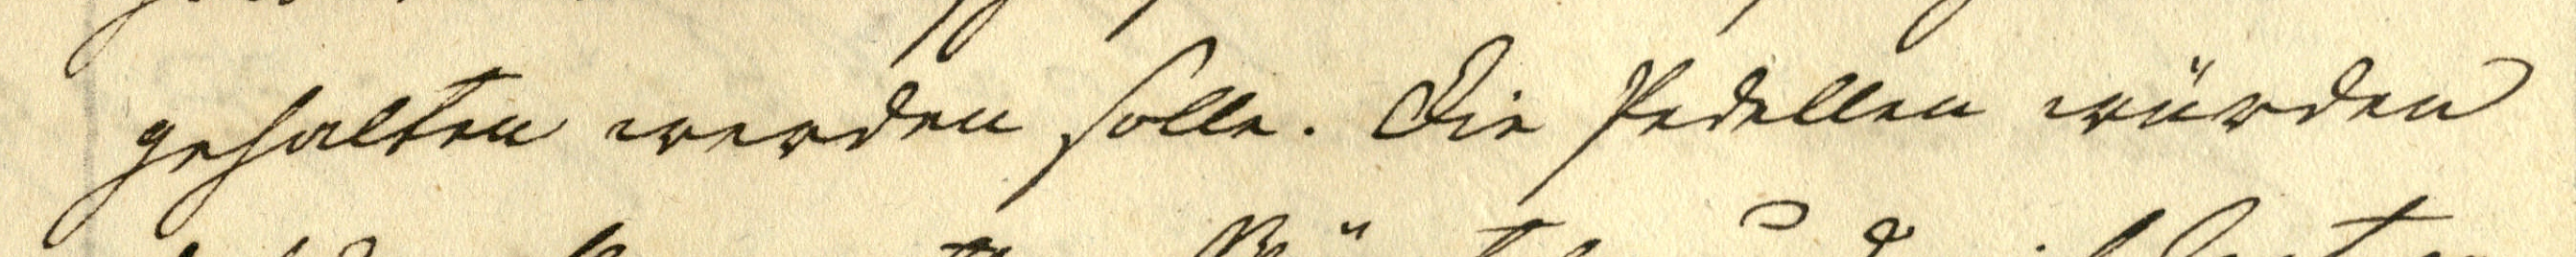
gehalten werden solle. Die Pedellen würden
